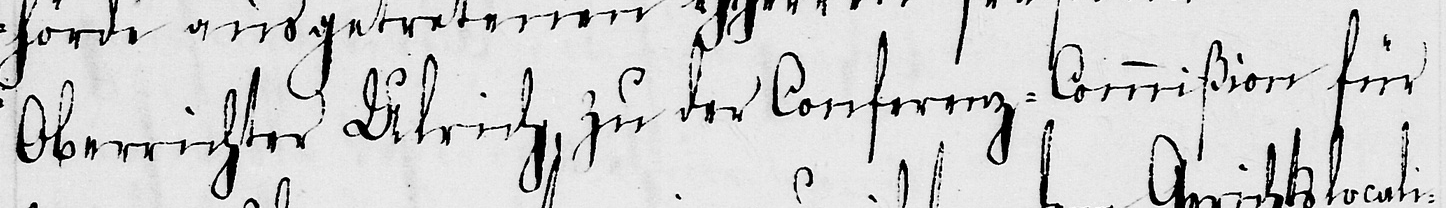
Oberrichter Ulrich, zu der Conferenz-Commißion für
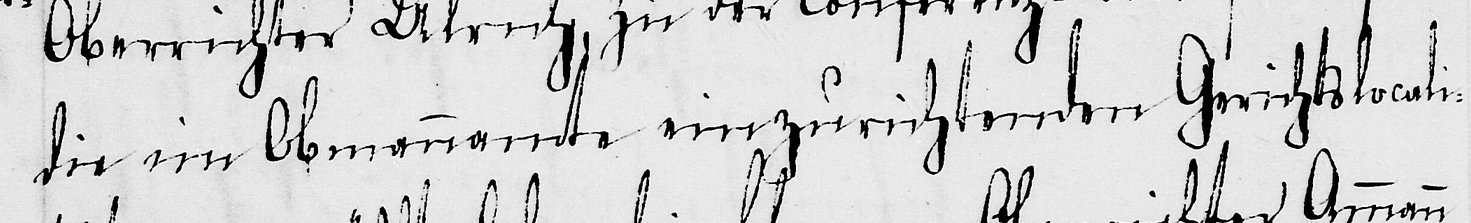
die im Obmannamte einzurichtenden Gerichtslocal¬
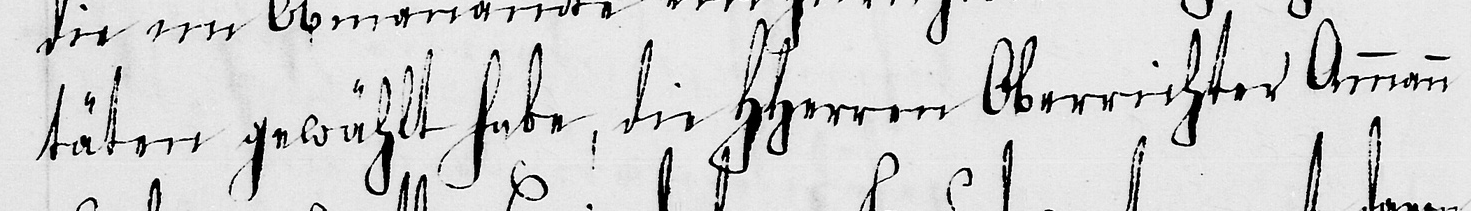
itäten gewählt habe, die HHerren Oberrichter Ammann
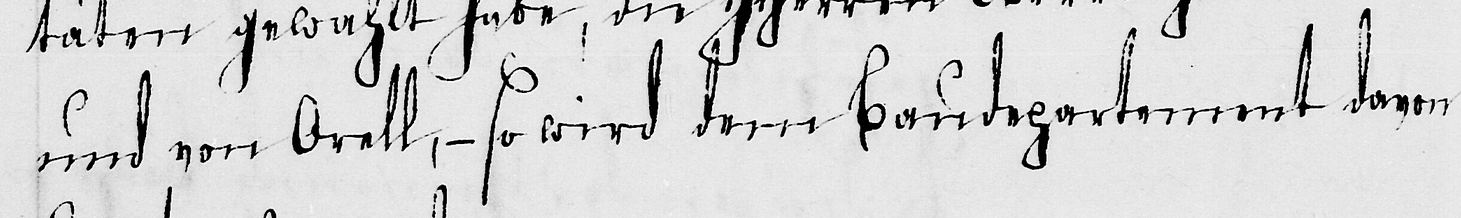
und von Orell, – so wird dem Baudepartement davon
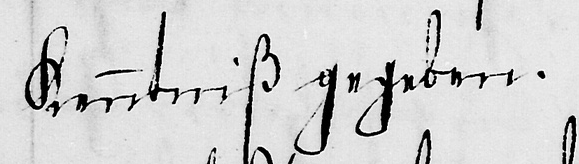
Kenntniß gegeben.
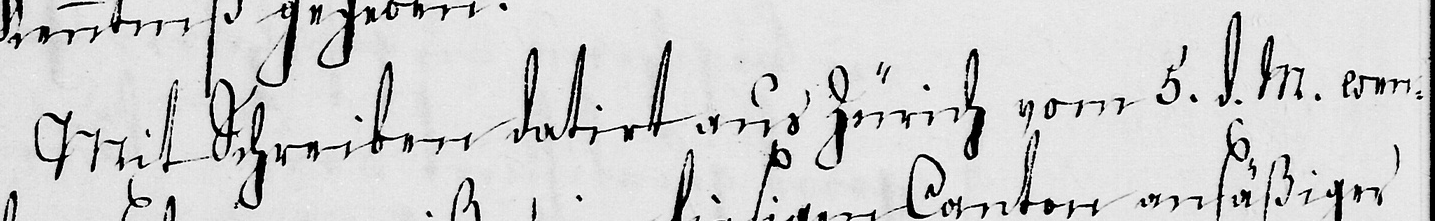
Mit Schreiben datirt aus Zürich vom 5. d. M. wen¬
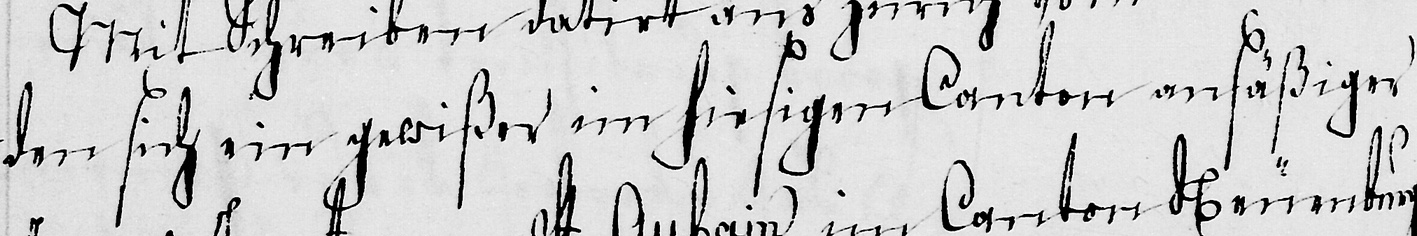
den sich ein gewißer im hiesigen Canton ansäßiger
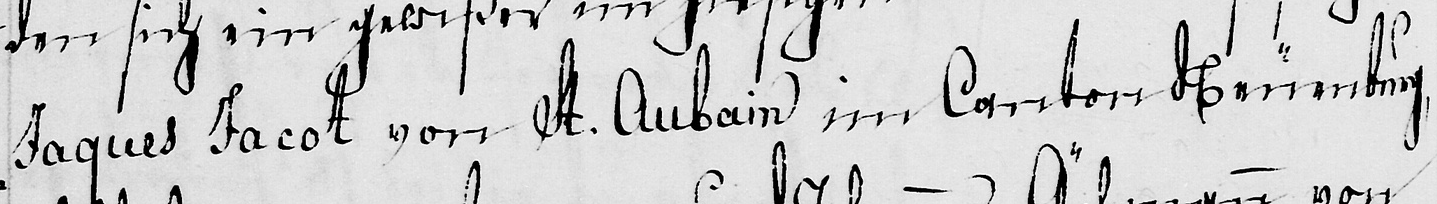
Jacques Facot von St. Aubain im Canton Neuenburg,
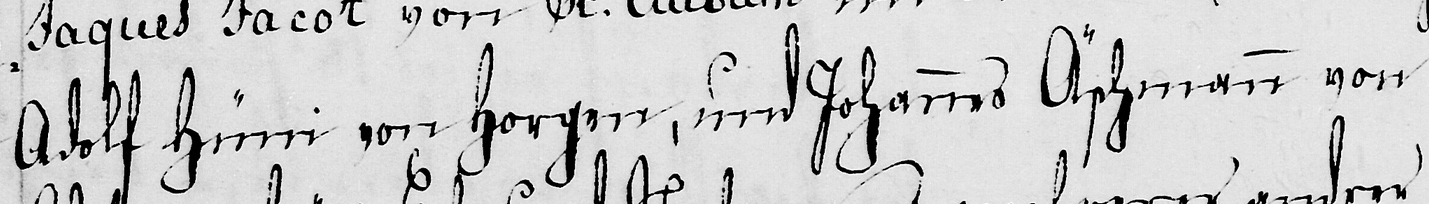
Adolf Hüni von Horgen, und Johannes Äschmann von
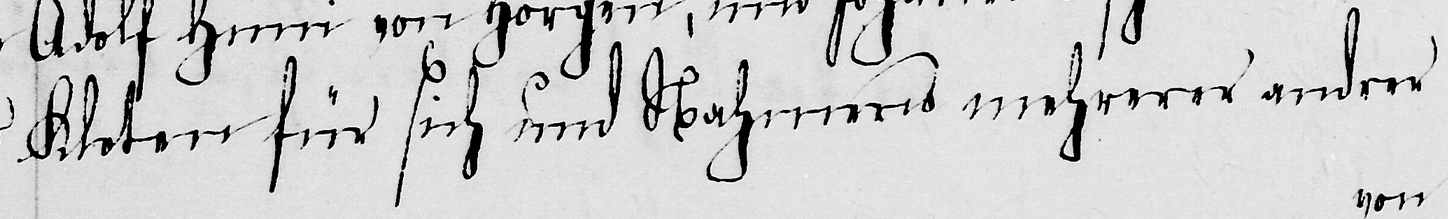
Kloten für sich und Nahmens mehererer andrer
